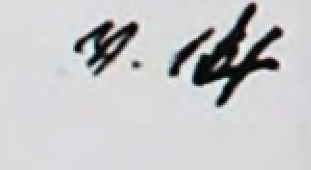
s. 14
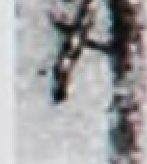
7
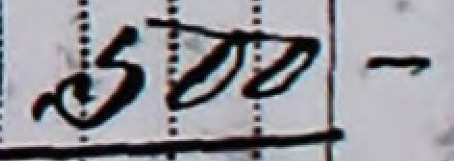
500 –
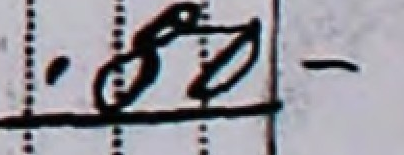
80 –
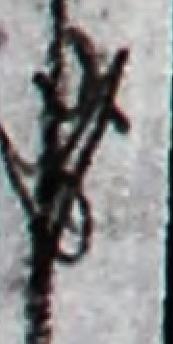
??
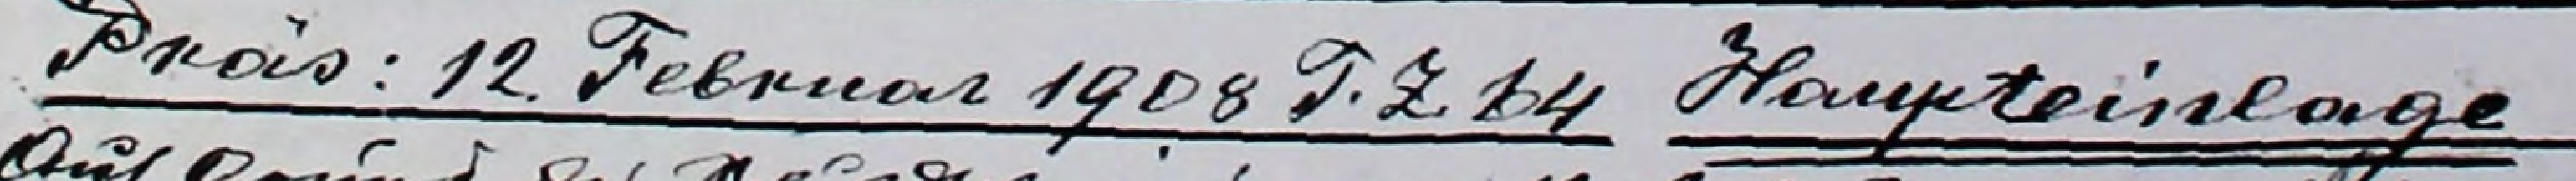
Präs: 12. Februar 1908 T.Z. 64 Haupteinlage
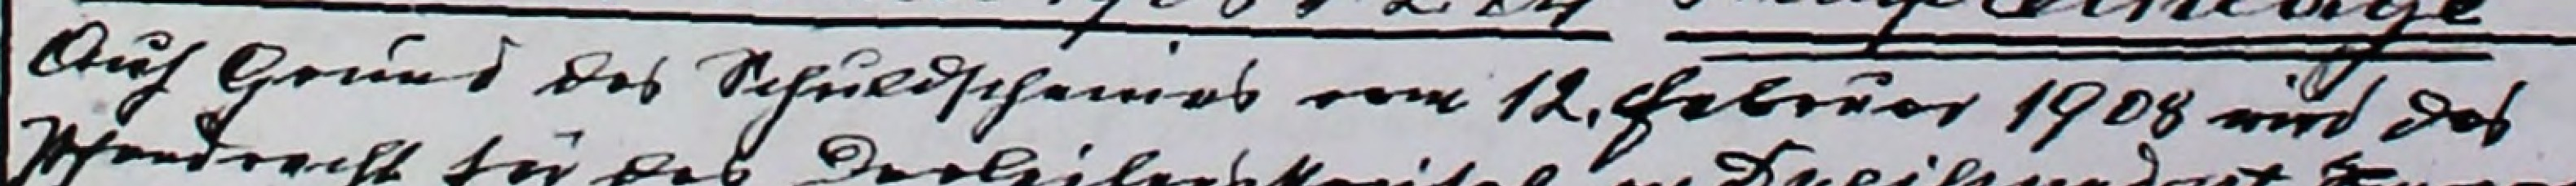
Auf Grund des Schuldscheines vom 12. Februar 1908 wird des
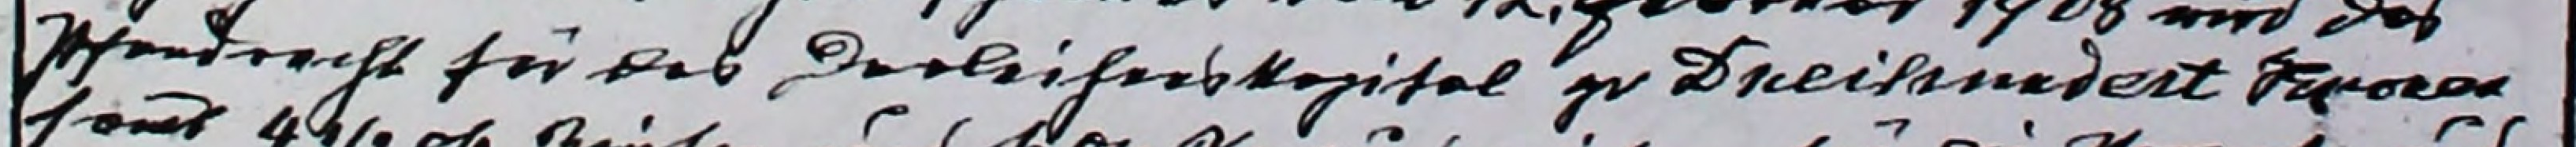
Pfandrecht für des Darleihenskapital pr Dreihundert Kronen
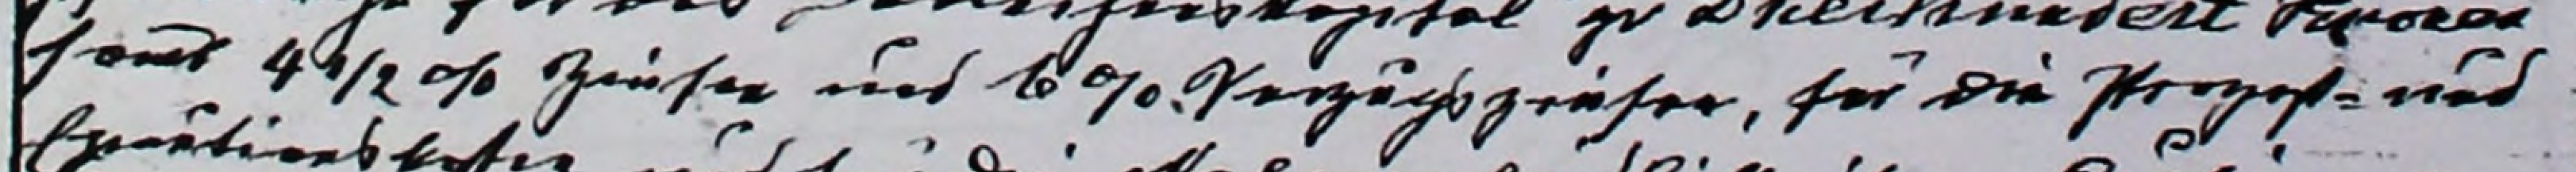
sammt 4 1/2 % und 6 % Verzugszinsen, für die Prozest= und
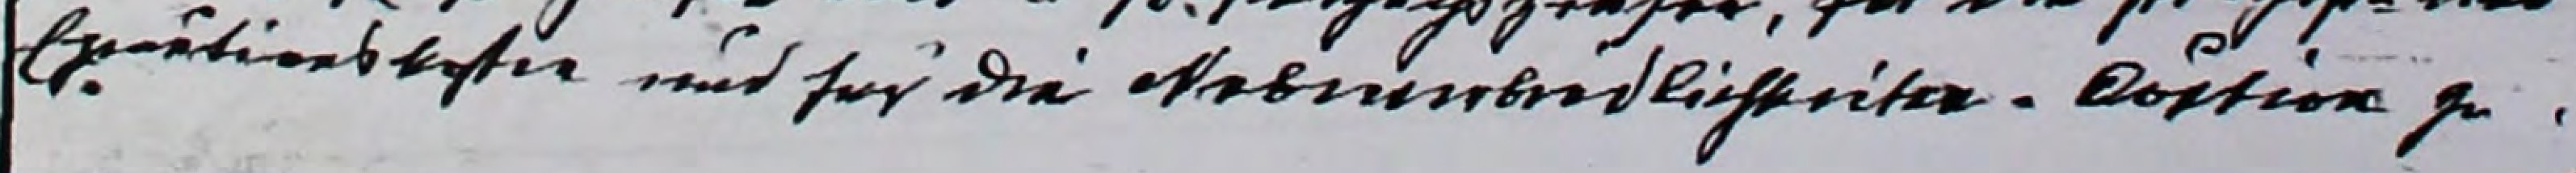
Executionskasten und für die Nebenverbindlichkeiten = Caution pr
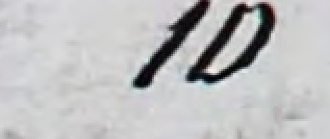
10
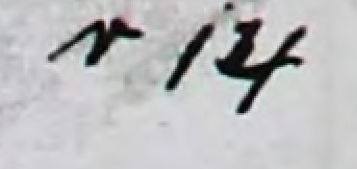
s 14
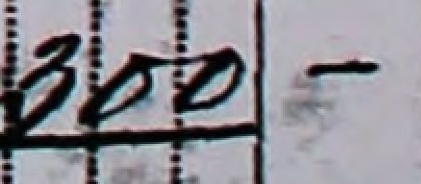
300 –
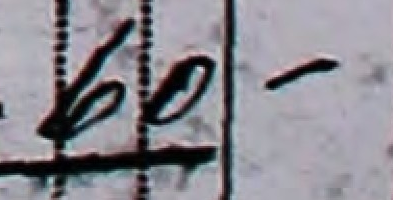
60 –
